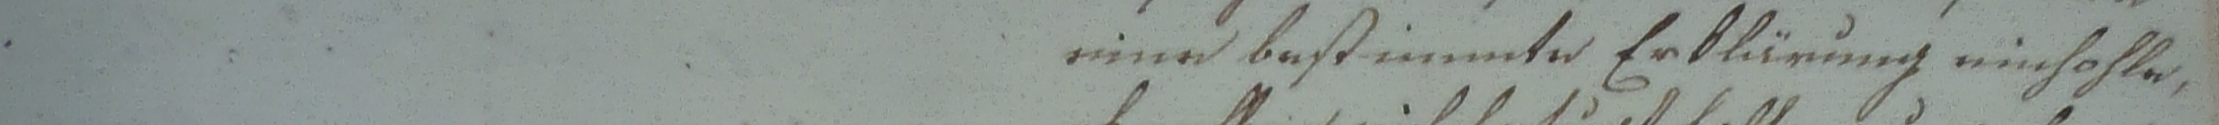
eine bestimmte Erklärung einhohle,
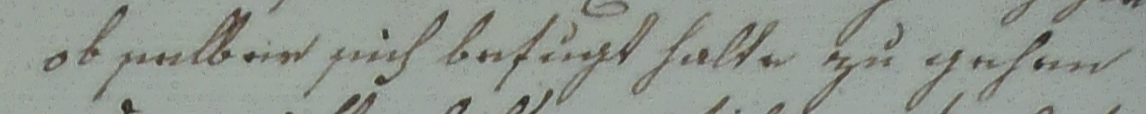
ob selber sich befugt halte zu gehen
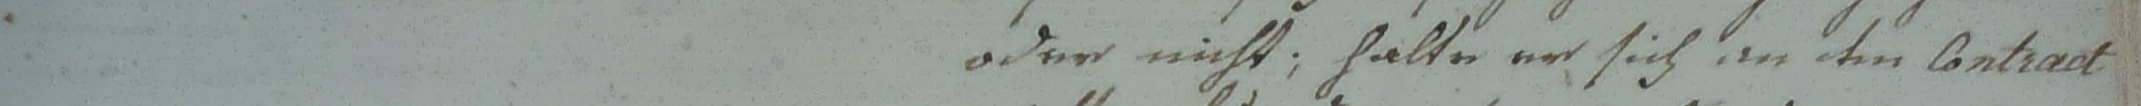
oder nicht; halte er sich an den Contract
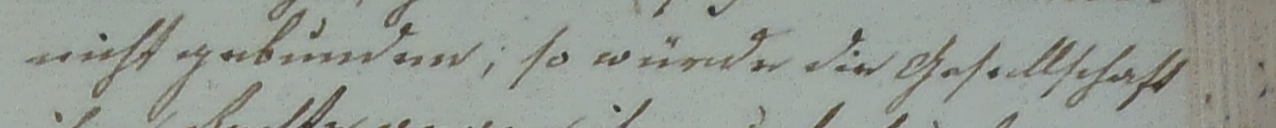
nicht gebunden; so würde die Gesellschaft
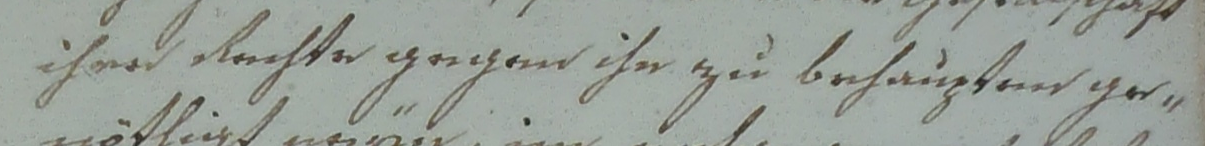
ihre Rechte gegen ihn zu behaupten ge¬
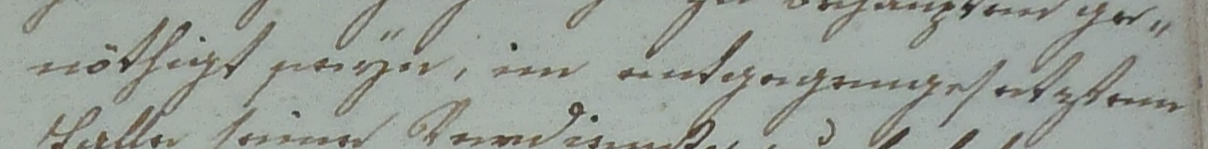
nöthigt seyn, im entgegengesetztem
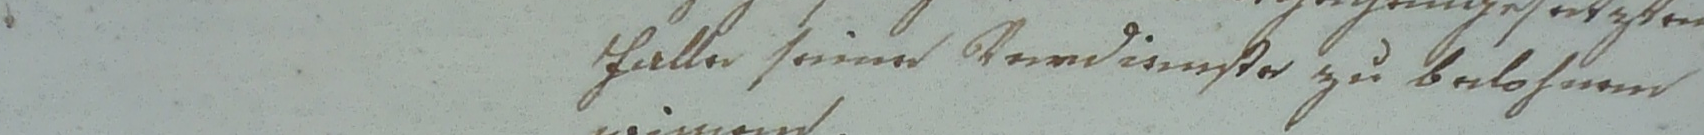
Falle seine Verdienste zu belohnen
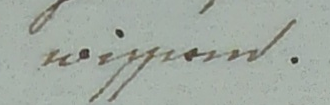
wissen.
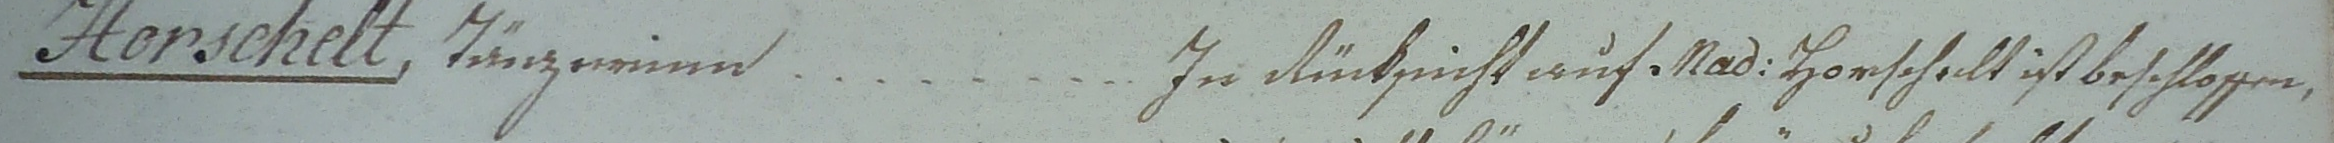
Horschelt, Tänzerinn ……… In Rücksicht auf Mad: Horschelt ist beschlossen,
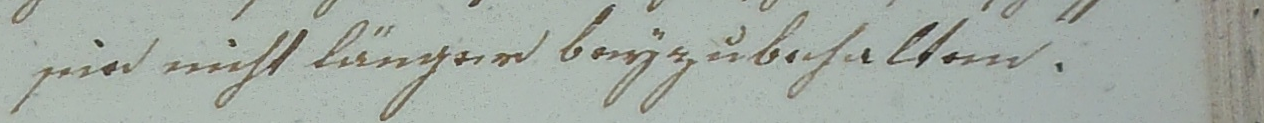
sie nicht länger beyzubehalten.
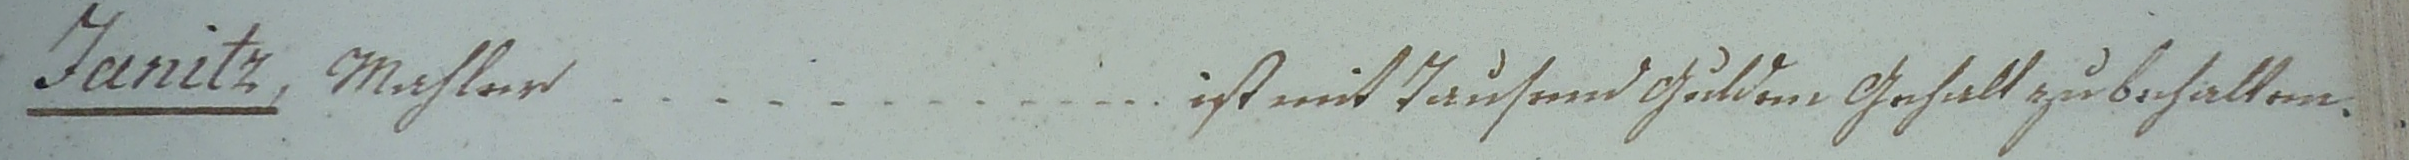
Janitz, Mahler …………. ist mit Tausend Gulden Gehalt zubehalten.
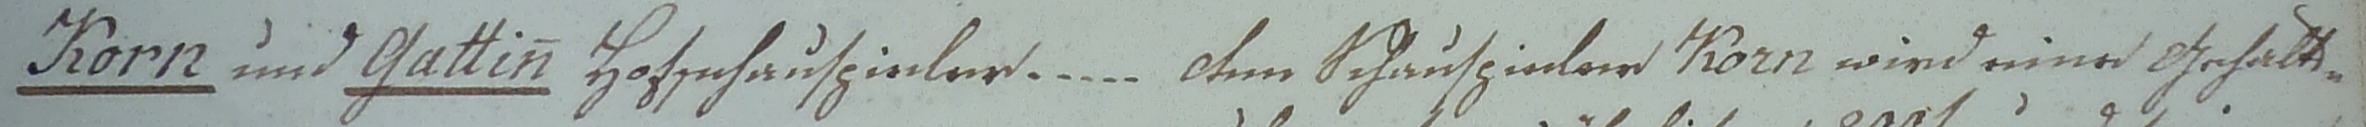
Korn und Gattin̅ Hofschauspieler ….. Der Schauspieler Korn wird eine Gehalts¬
